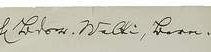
Herrn Bdsr. Welti, Bern.
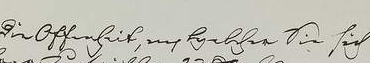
Die Offenheit, mit welcher Sie sich
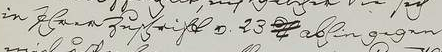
in Ihrer Zuschrift v. 23. ds abhin gegen
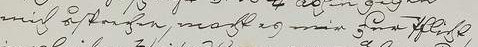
mich aussprechen, macht es mir zur Pflicht,
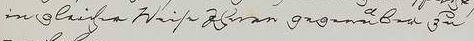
in gleicher Weise Ihnen gegenüber zu
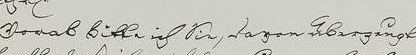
Vorab bitte ich Sie, davon überzeugt
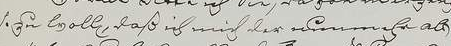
s. zu wollen, daß ich mich der nunmehr als
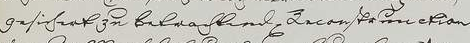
gesichert zu betrachtenden Reconstruction
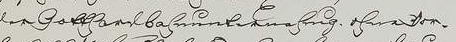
der Gotthardbahnunternehmg. ohne Vor-
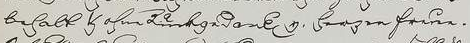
behalt & ohne Rückgedanken v. Herzen freue.
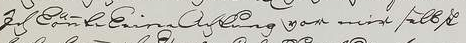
Ich könnte keine Achtung vor mir selbst
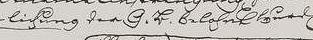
lichung der G.B. belohnt wurden,
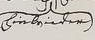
hinwieder
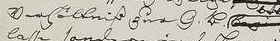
Verhältniß zur G.B. beziehen,
